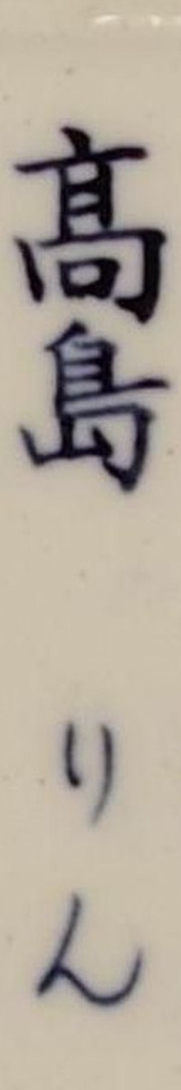高島りん
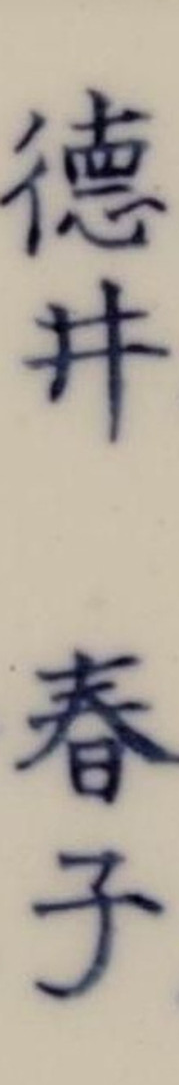徳井春子
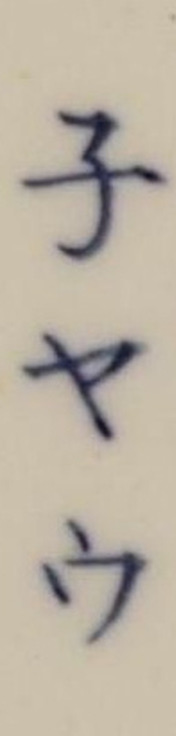子ヤウ
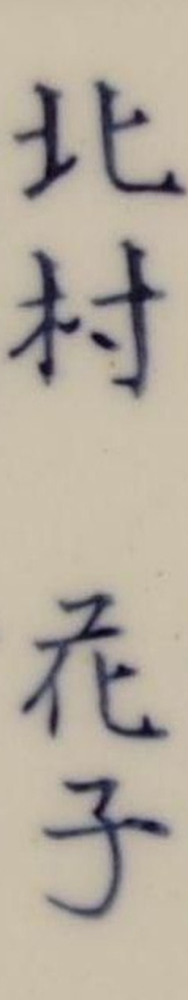北村花子
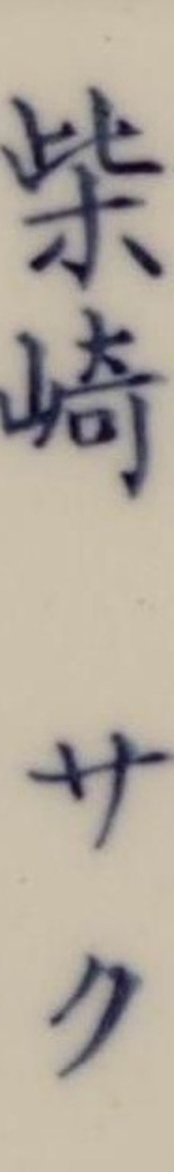柴崎サク
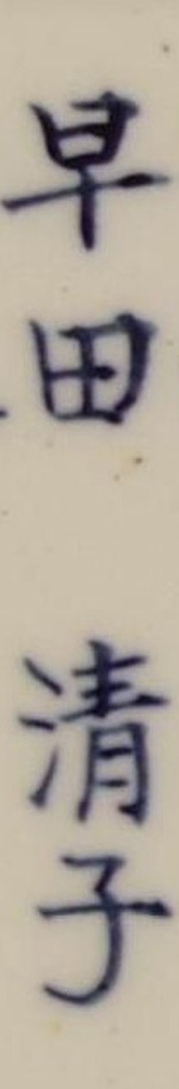早田清子
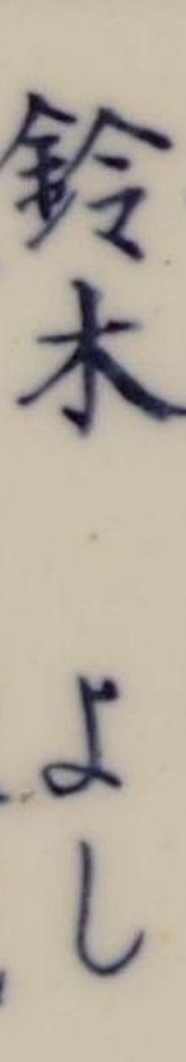鈴木よし
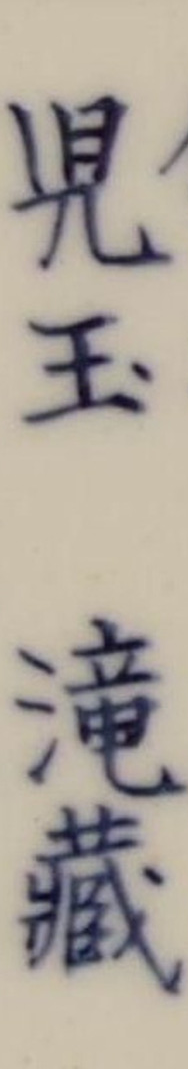児玉滝蔵
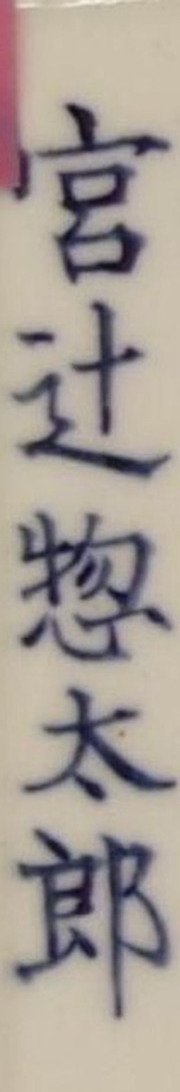宮辻惣太郎

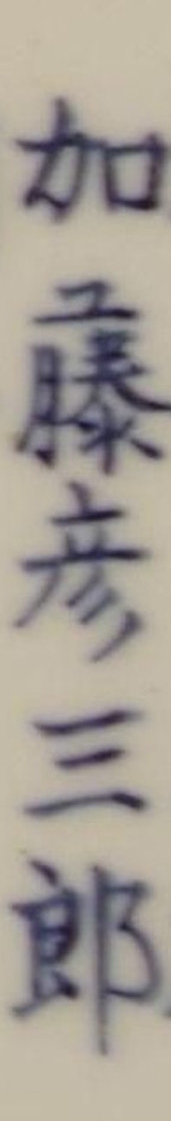加藤彦三郎
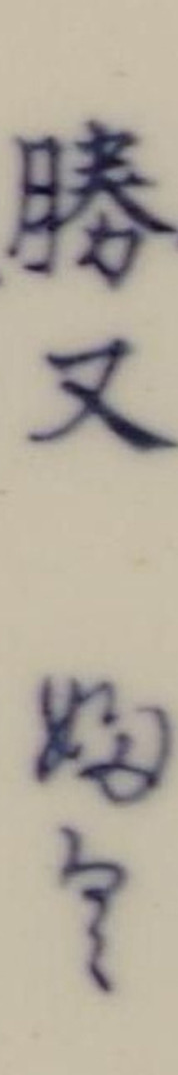勝又ふく
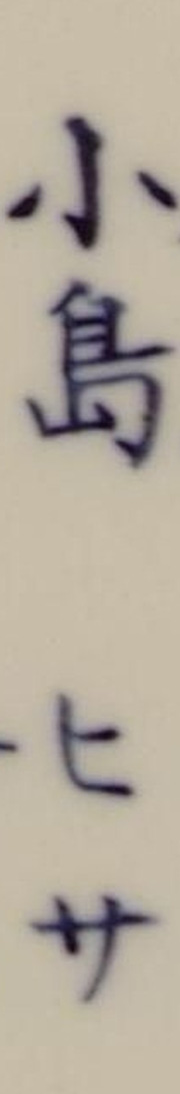小島ヒサ
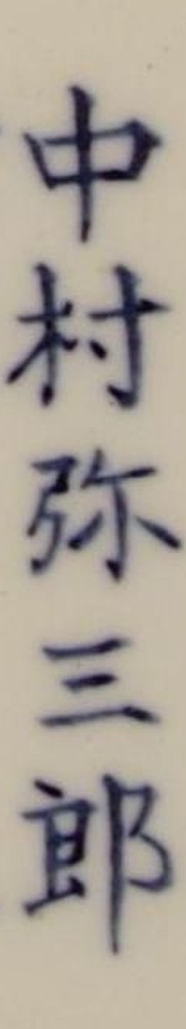中村弥三郎
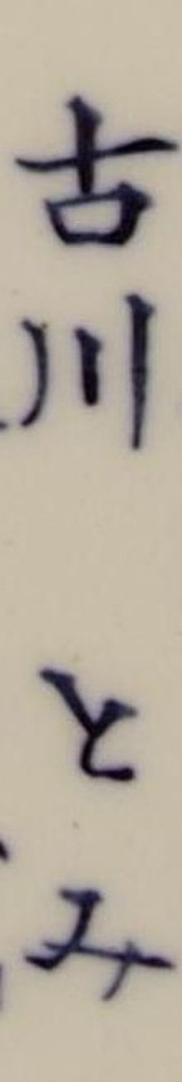古川とみ
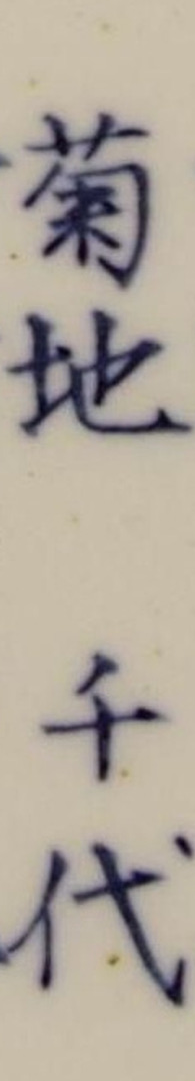菊地千代
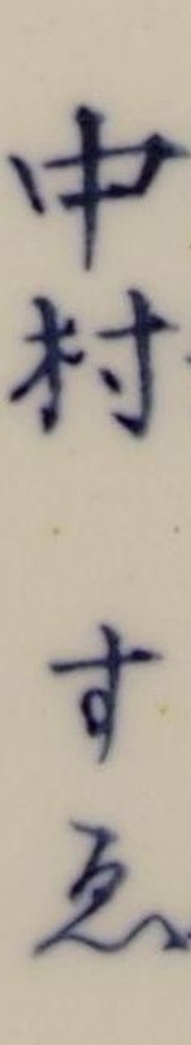中村すえ
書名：E~L
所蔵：高野山金剛峯寺
